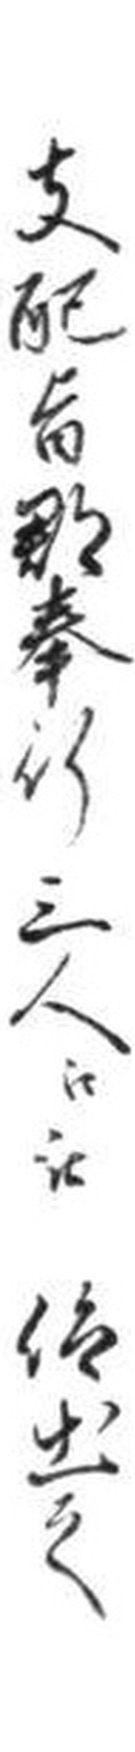支配旨郡奉行三人江被仰出之
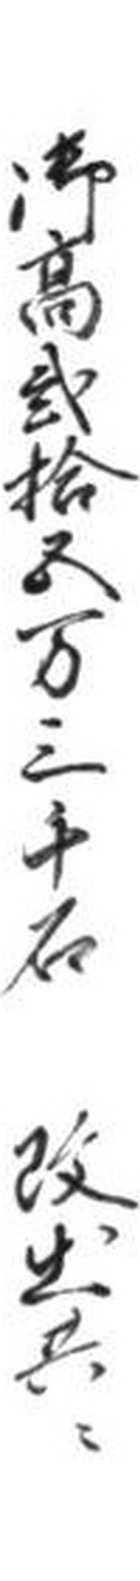御高弐拾五万三十石改出共ニ
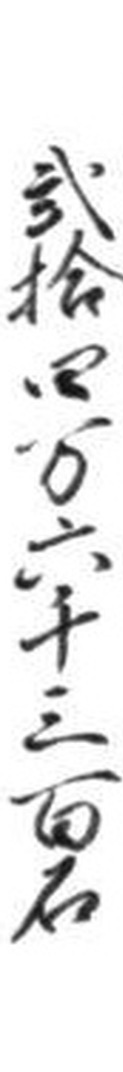弐拾四万六千三百石
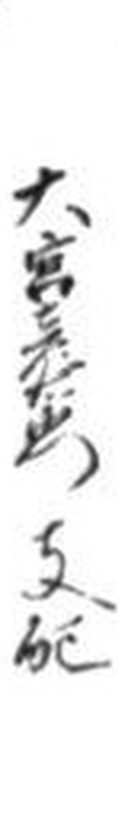内大宮彦右衛門支配
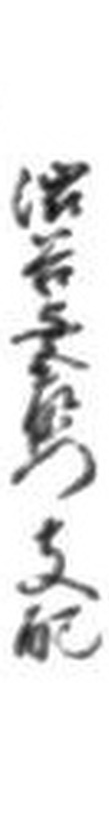渋谷与五左衛門支配
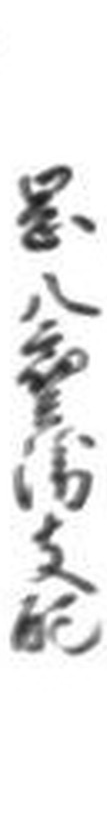岡八郎兵衛支配
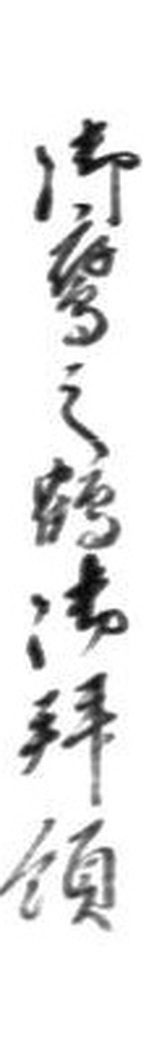御鷹之鶴御拝領
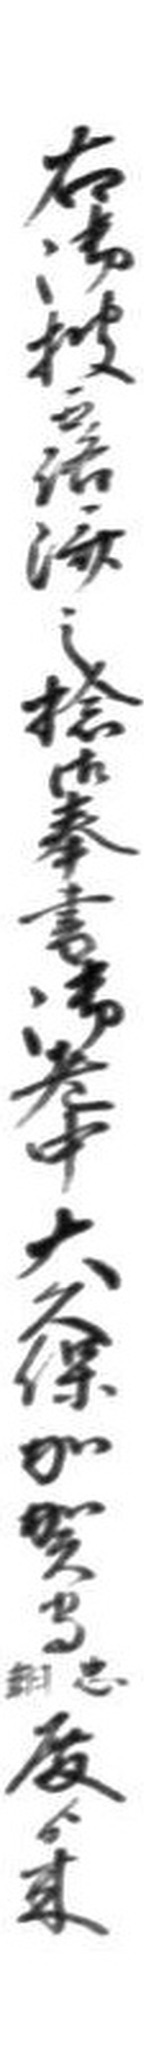右御披露済之捻御奉書御老中大久保加賀守忠朝殿ゟ来

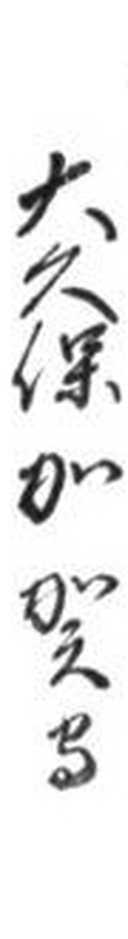大久保加賀守
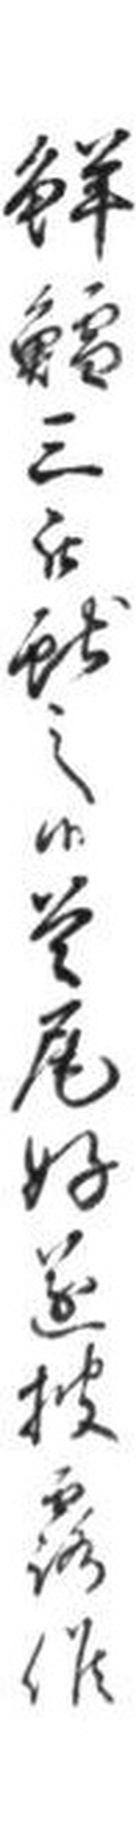鮮鱈三被献之候首尾好遂披露作
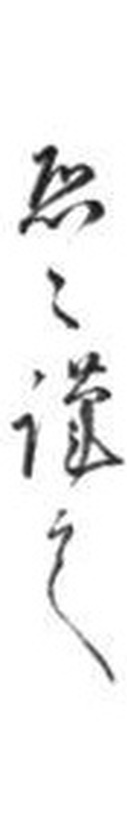恐々謹言
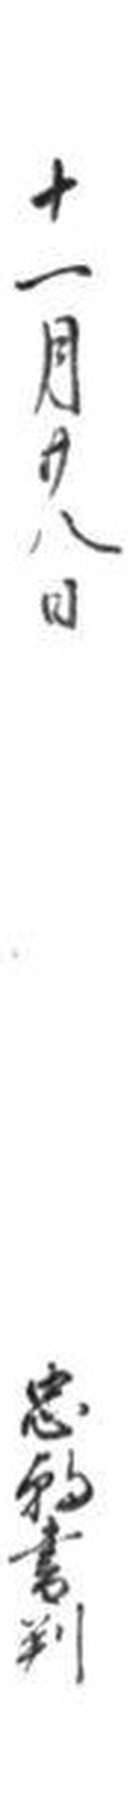十一月廿八日忠朝書判
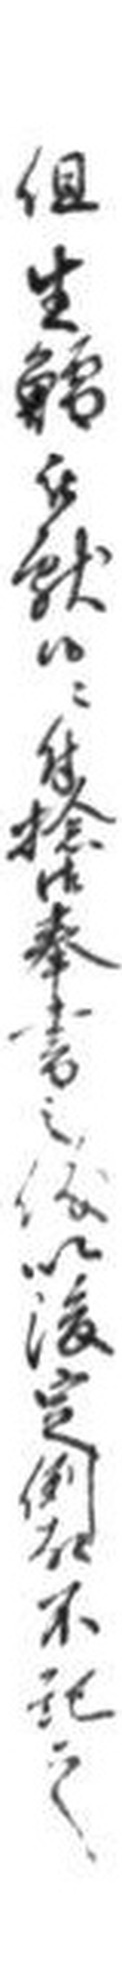但生鱈被献候ニ付捻御奉書之儀以後定例故不記之
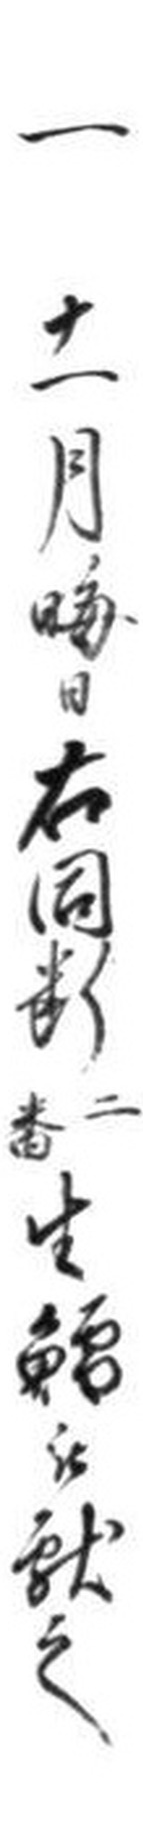一十一月晦日右同断二番生鱈被献之
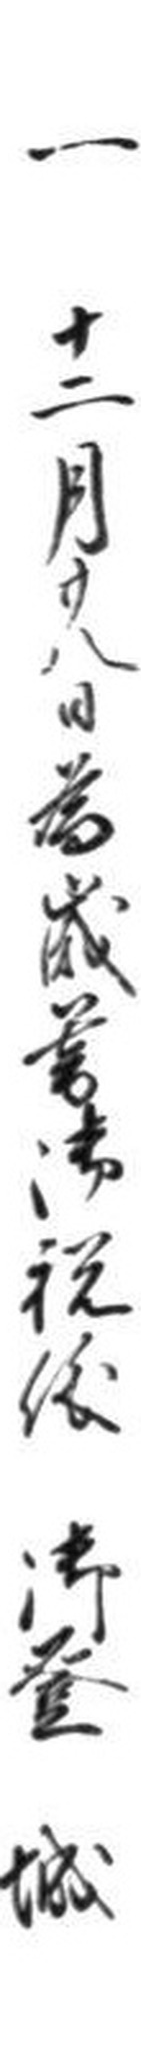一十二月廿八日為歳暮御祝儀御登城
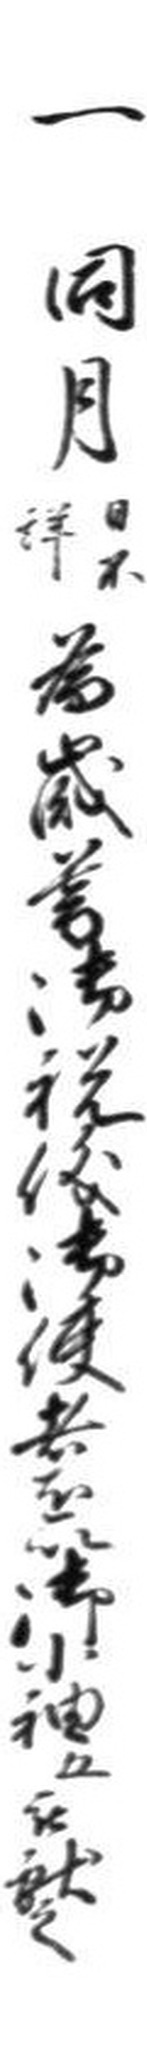一同月日不詳為歳暮御祝儀御使者を以御小袖五被献之
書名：家譜 十六 吉品公 従貞享三年閏三月到同四年
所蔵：福井県文書館 Fukui Prefectural Archives
